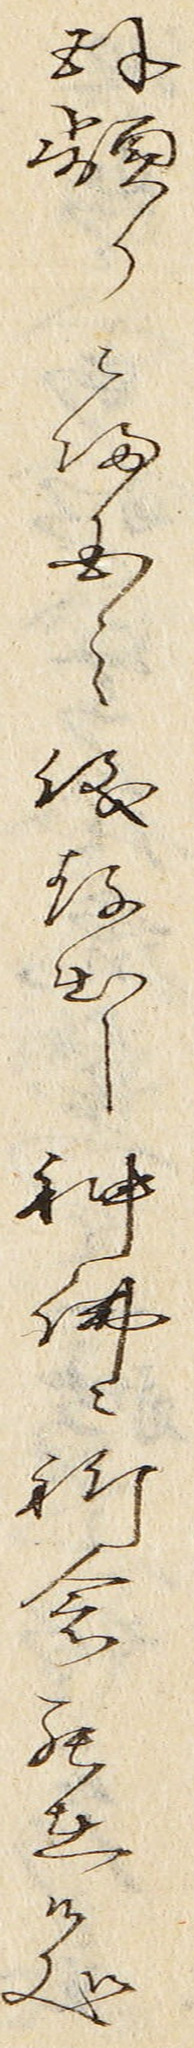臥頻りに帰国之儀存出し神仏に祈念罷在候処
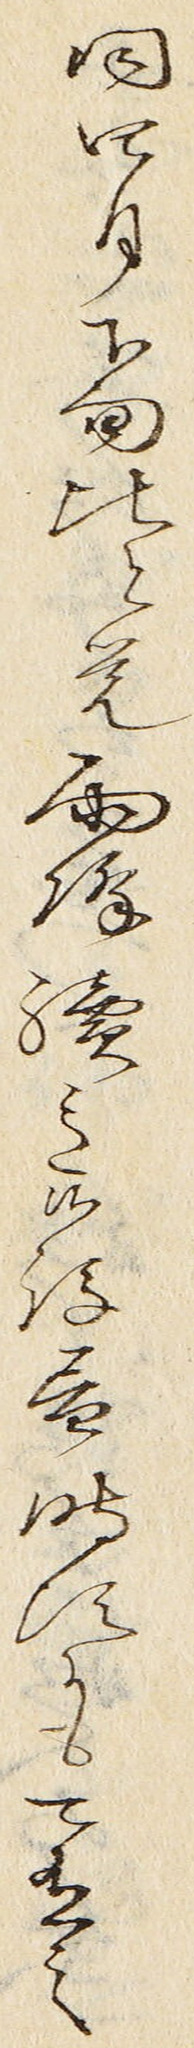同四月下旬比と覚雨降続にて候後昼時頃にも可有之
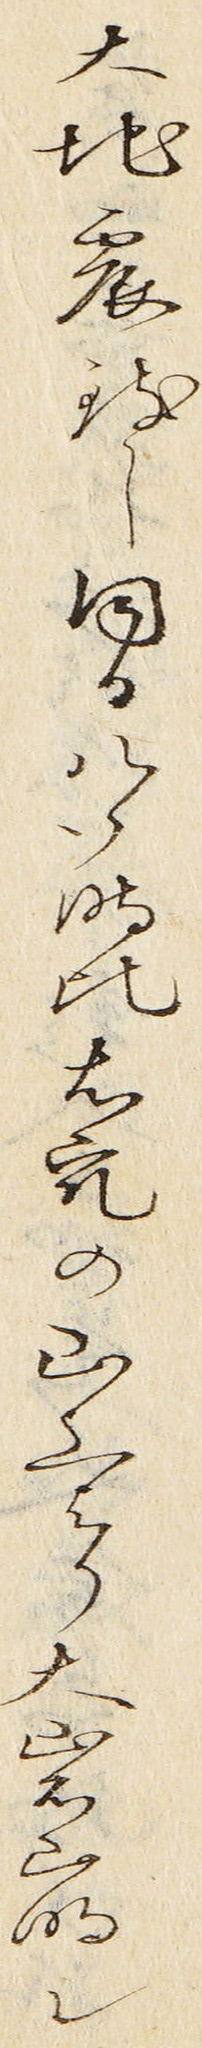大地震致し同日八ッ時比右穴の山上より大岩崩れ
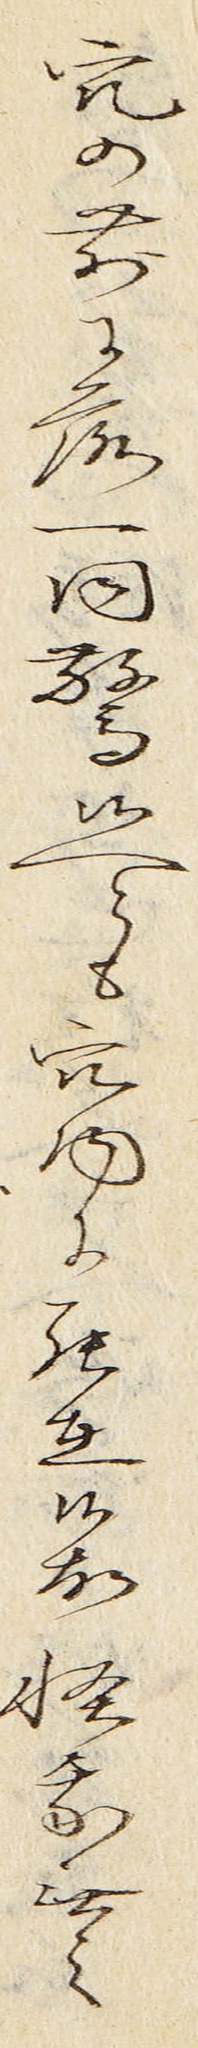穴の前に落一同驚候へとも穴内に罷在候故怪我無之
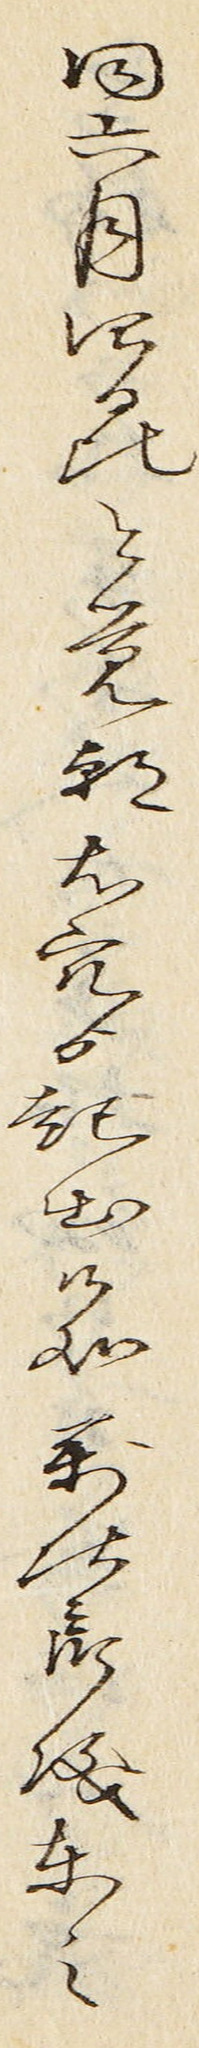同六月四日比と覚朝右穴ゟ起出候処万次郎儀東之
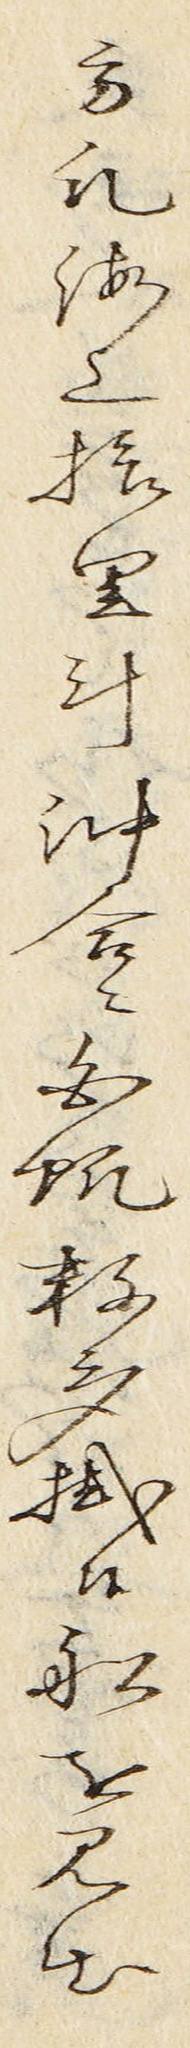方凡海上拾里計沖合に白帆数多掛候船を見出
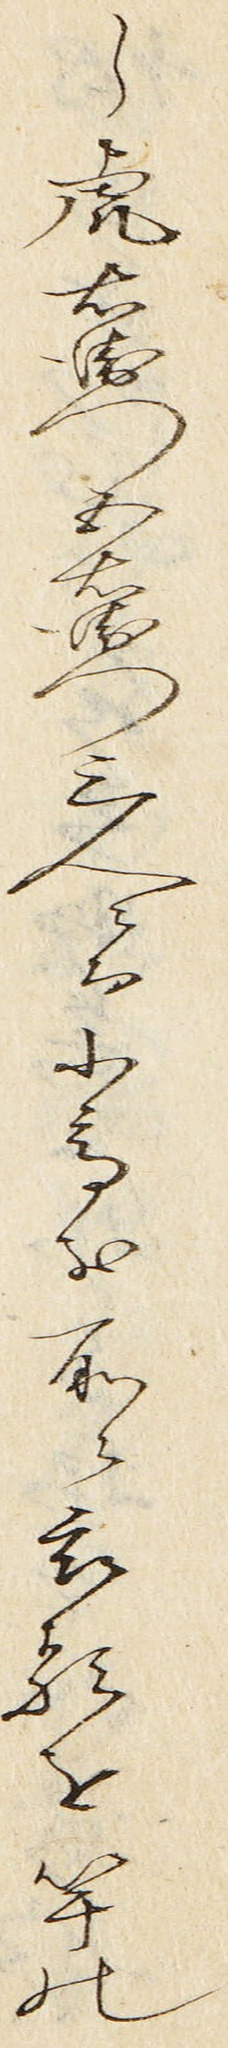し虎右衛門五右衛門三人に而小高き所に衣類を竿の
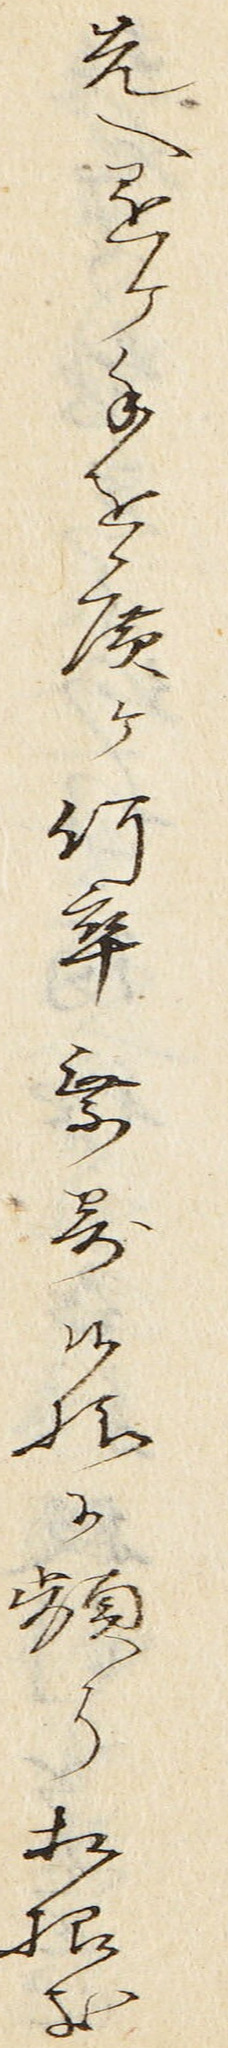先へ懸ヶ手を広ヶ何卒乗寄候様に頻り相振き
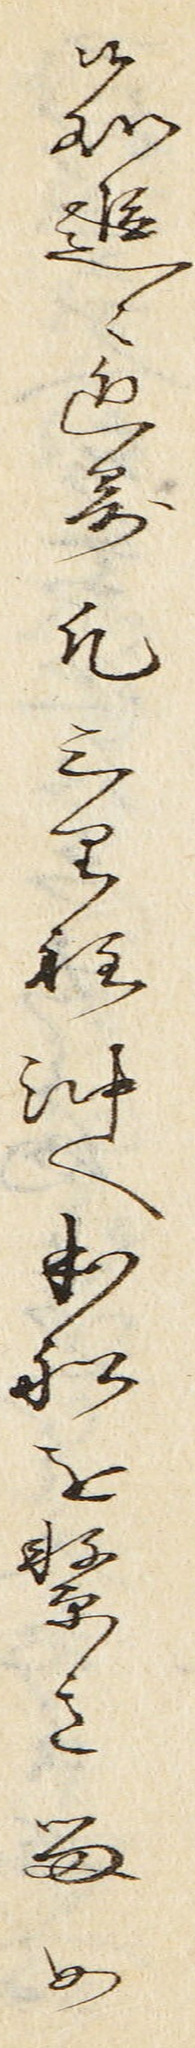候処追々近寄凡三里程沖へ本戦を繋き留め
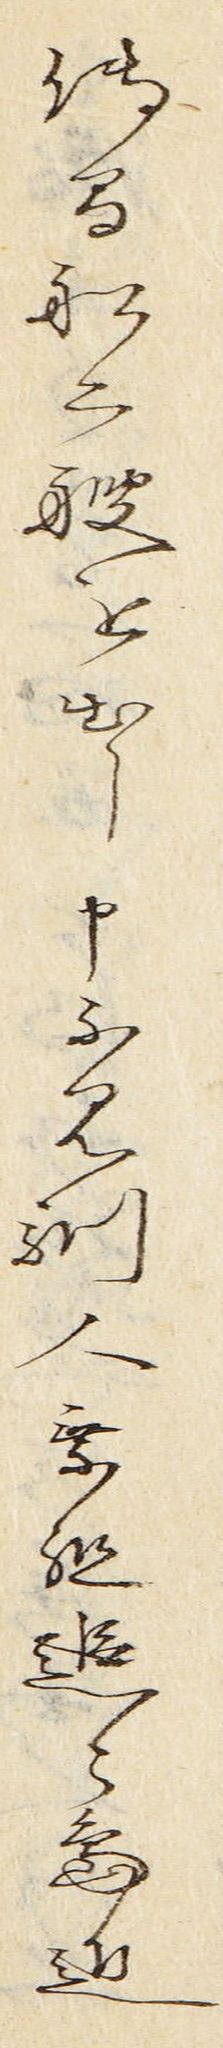伝間船二艘を出し申不見馴人乗組追々島近

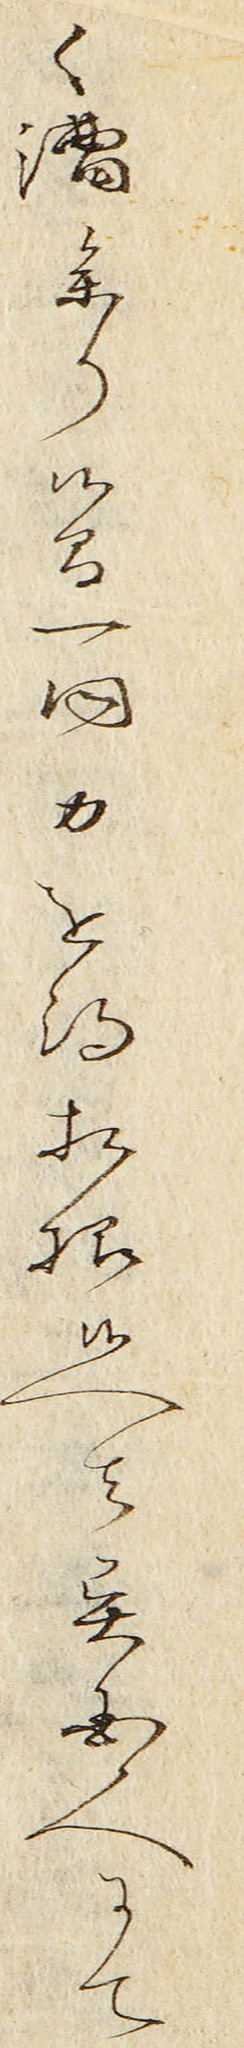く漕参り候間一同力を得相振候へは異国人にて
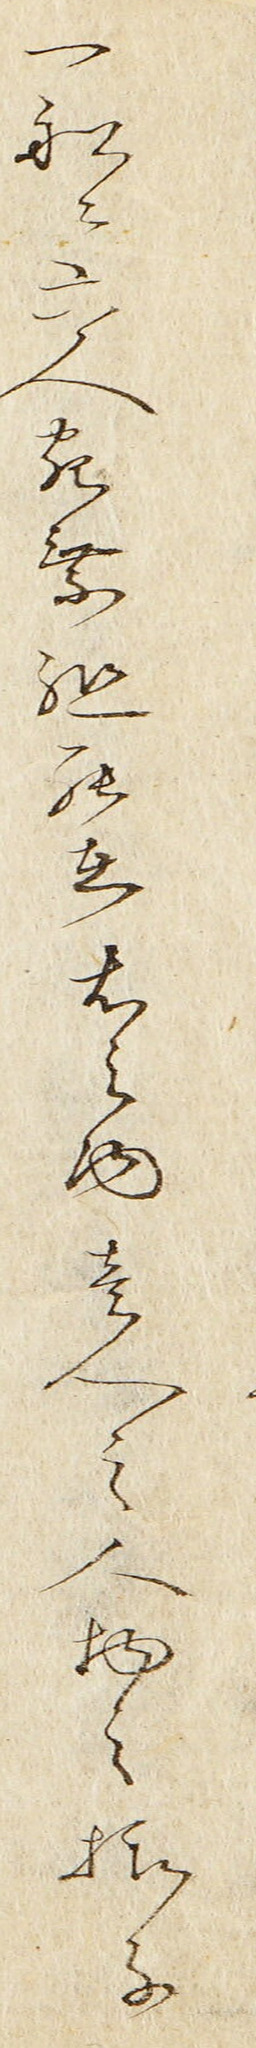一船に六人宛乗組罷在右之内壱人之人物之様子
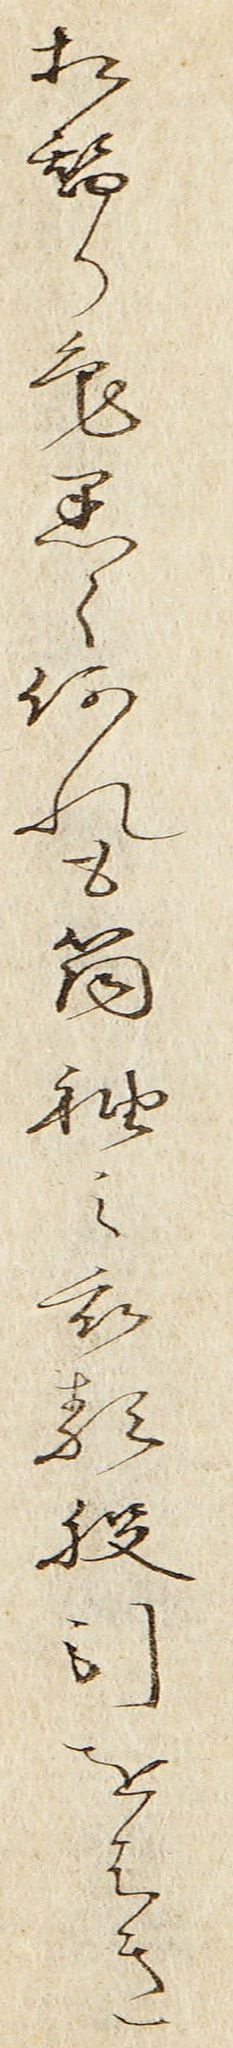相替り色黒く何れも筒袖之衣類股引をはき
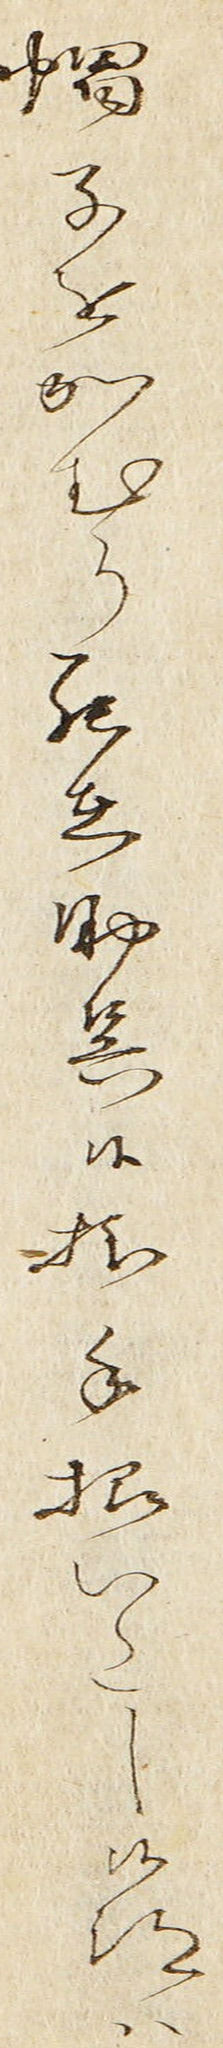帽子をかむり罷在助呉候様手振りいたし候得は
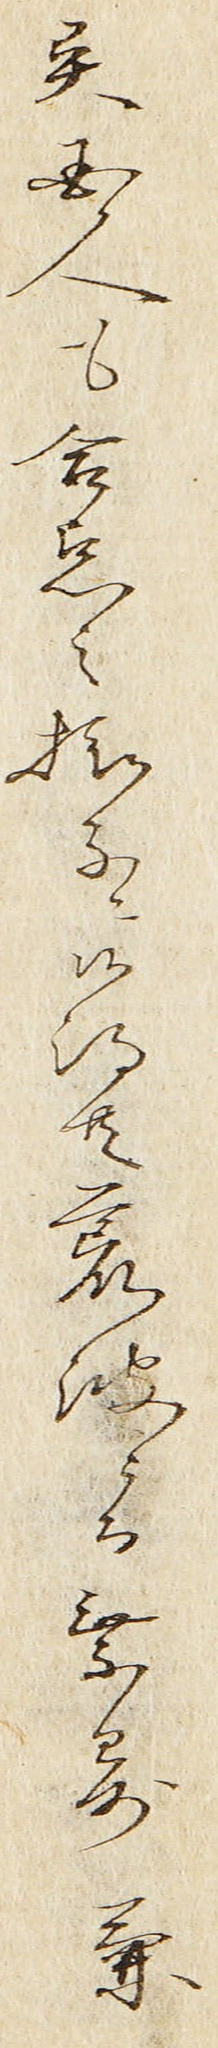異国人も合点之様子に候得共荒波に而乗寄兼
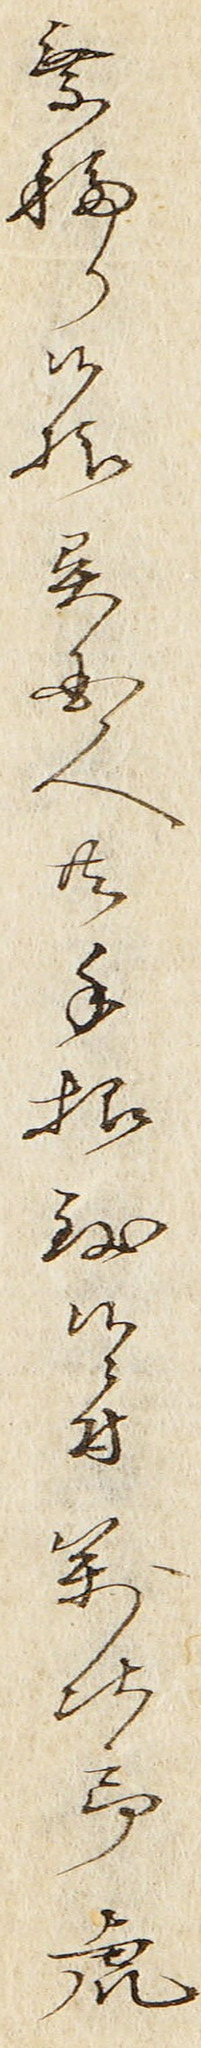乗移り候様異国人共手振致候に付万次郎虎
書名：土佐中浜万次郎漂流記
